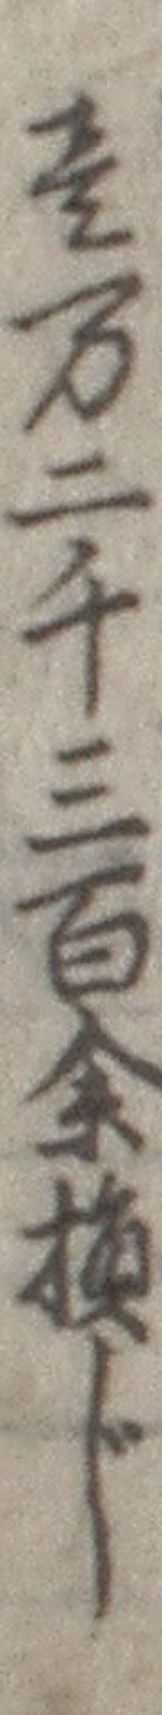壱万二千三百余損じ
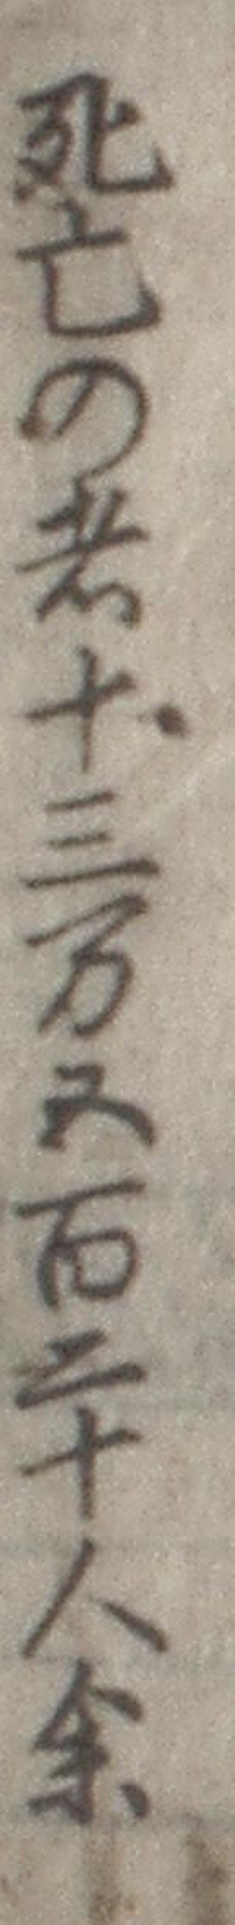死亡の者十三万五百二十人余
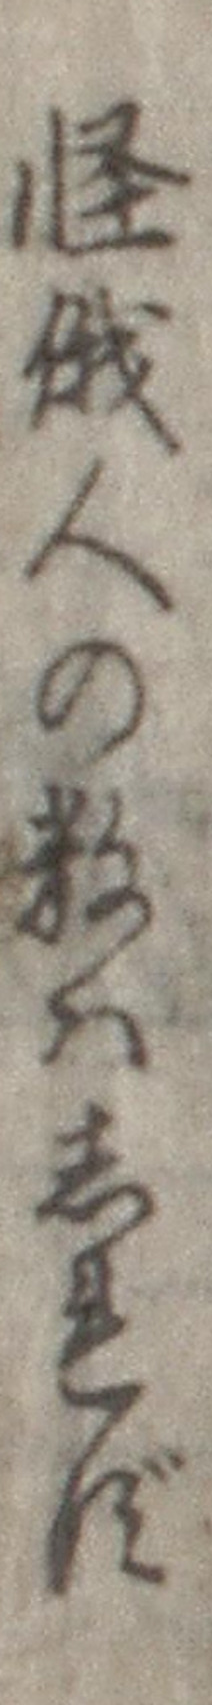怪我人の数ハしれず
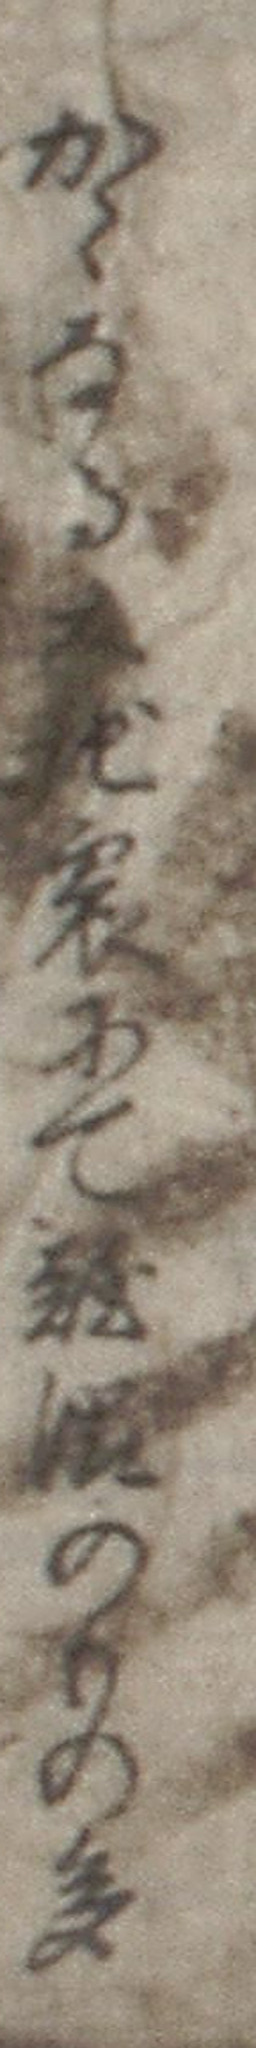かくなる大地震にて難渋のもの多
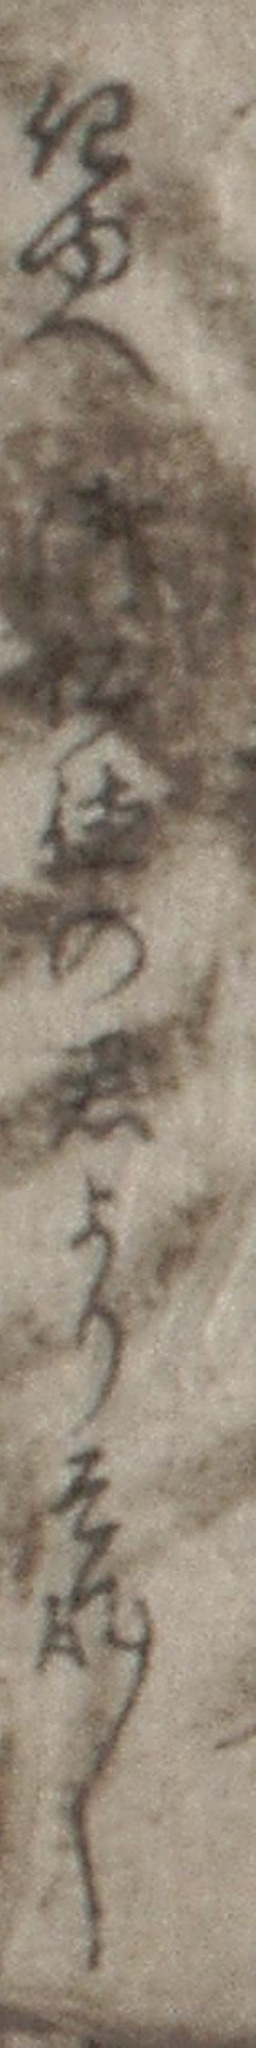きゆへ御松徳の君よりそれ〳〵
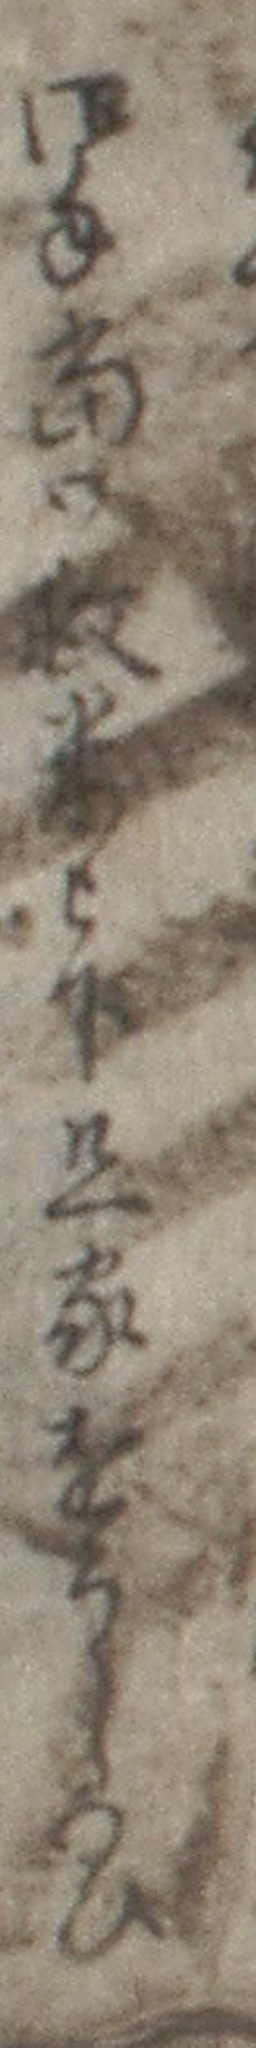御手当御救米被下候一家をうしなひ
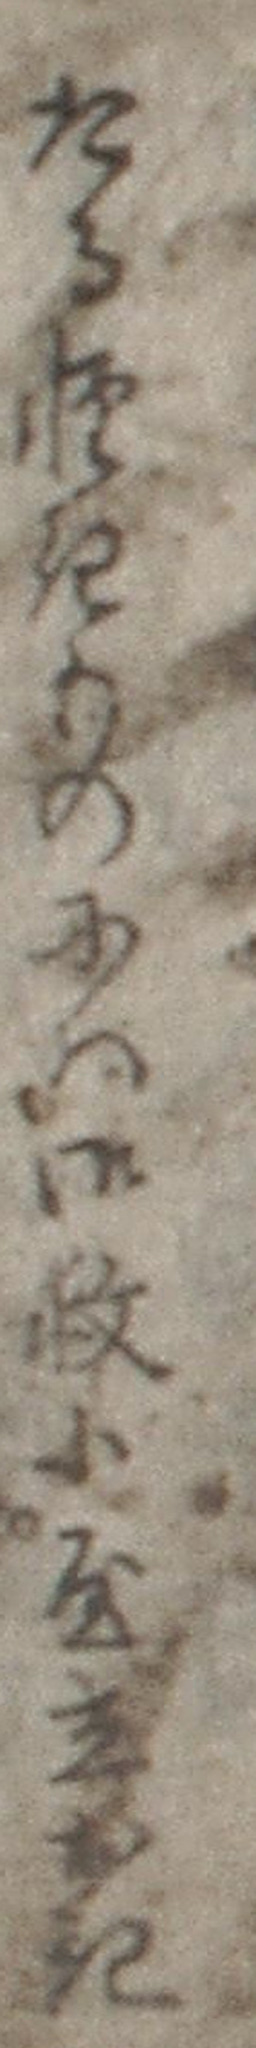たる軽きものにハ御救小屋立おき
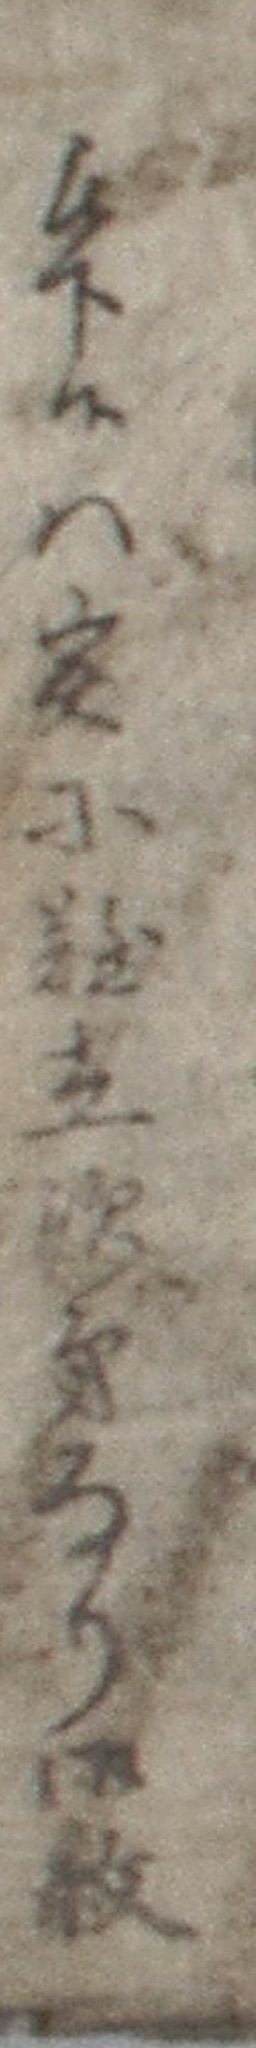被下候ハ実に難有次第なり御救
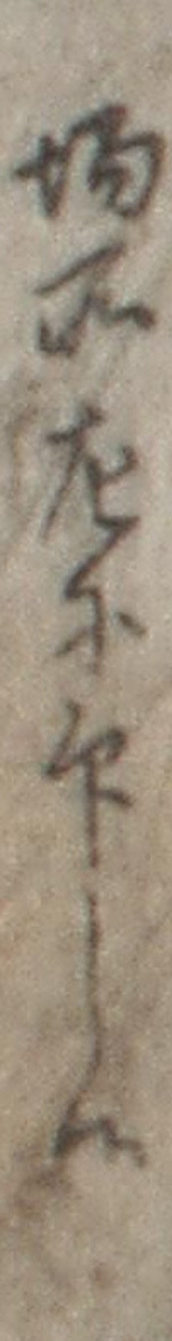場所左に印し候

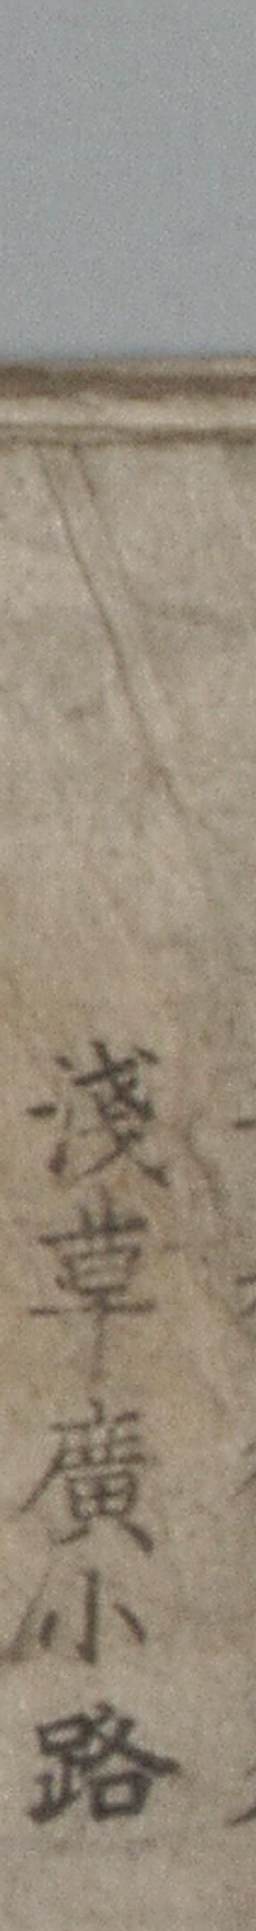浅草広小路
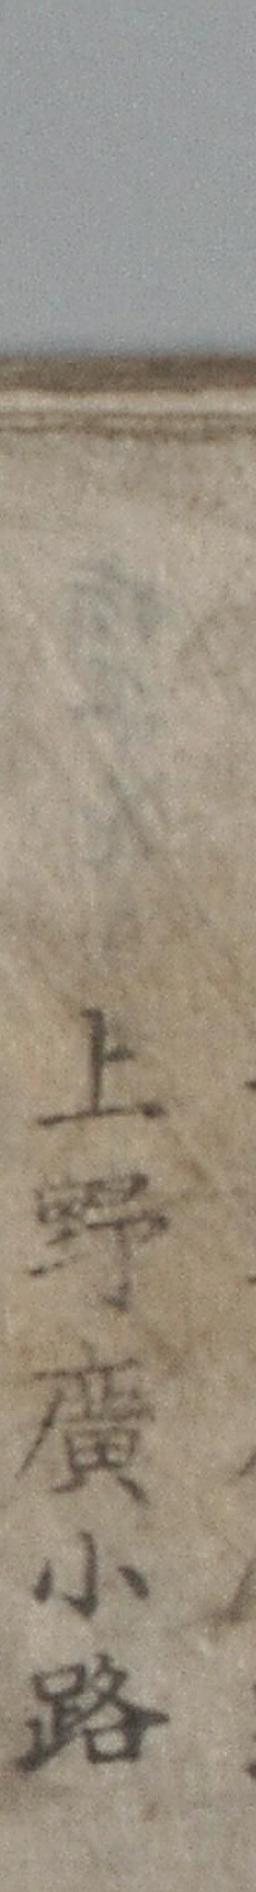上野広小路
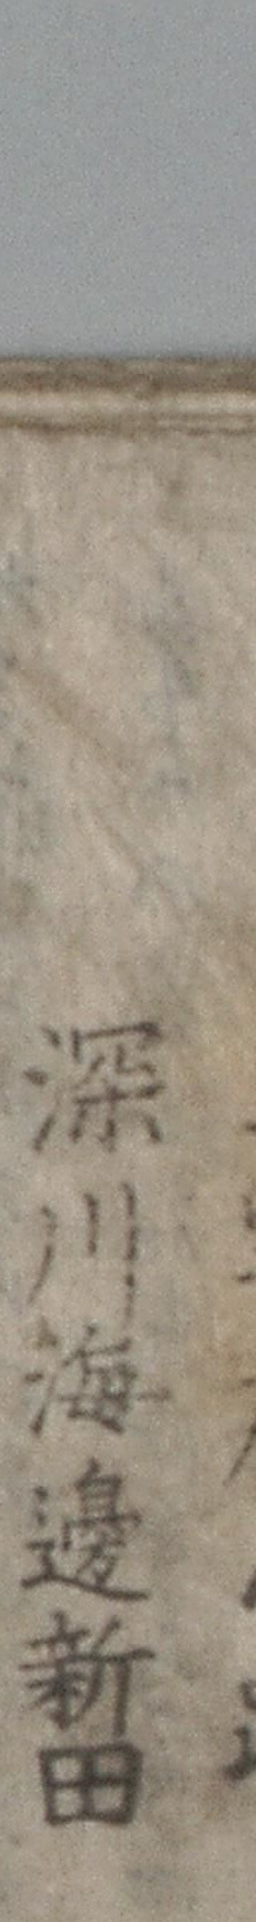深川海辺新田
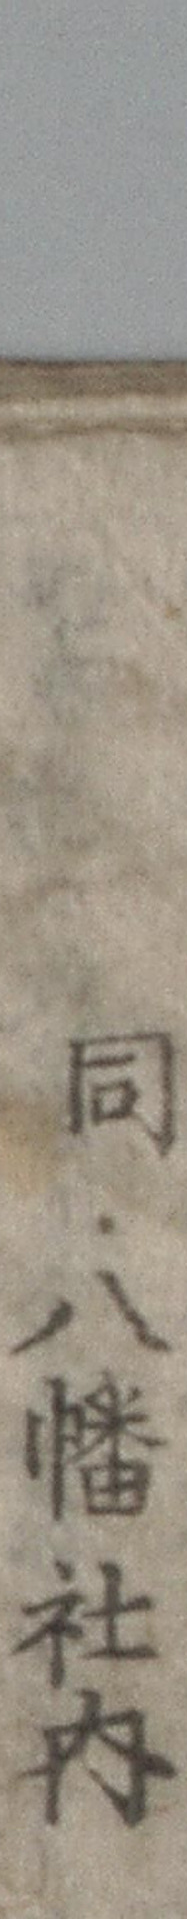同八幡社内
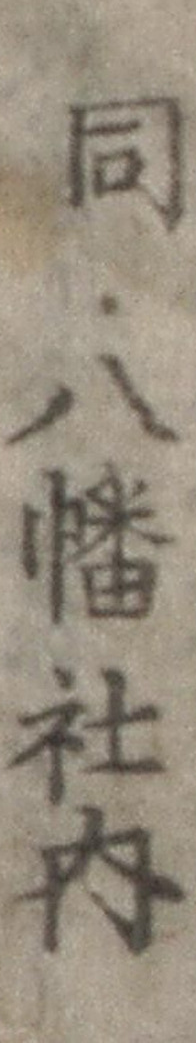同八幡社内
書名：江戸　大地震臣細録　全
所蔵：東京大学地震研究所図書室 Earthquake Research Institute Library, The University of Tokyo, JAPAN
